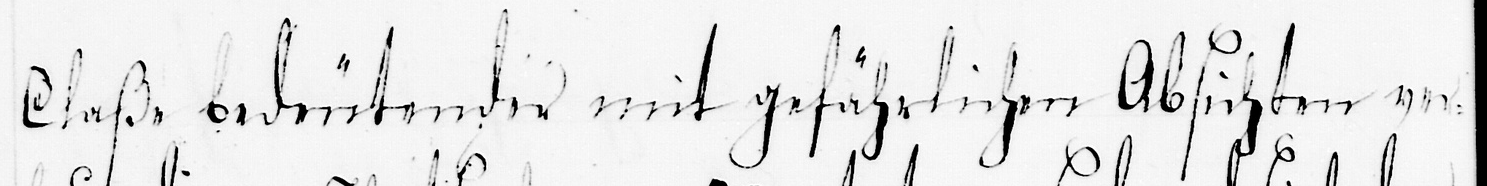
Claße bedeutender mit gefährlichen Absichten ver¬
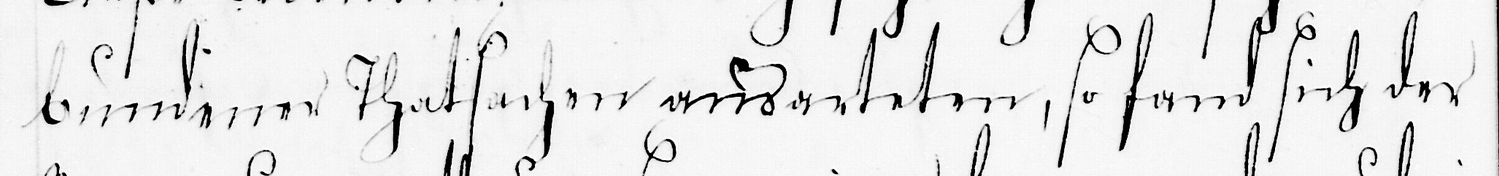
bundener Thatsachen ausarteten, so fand sich der
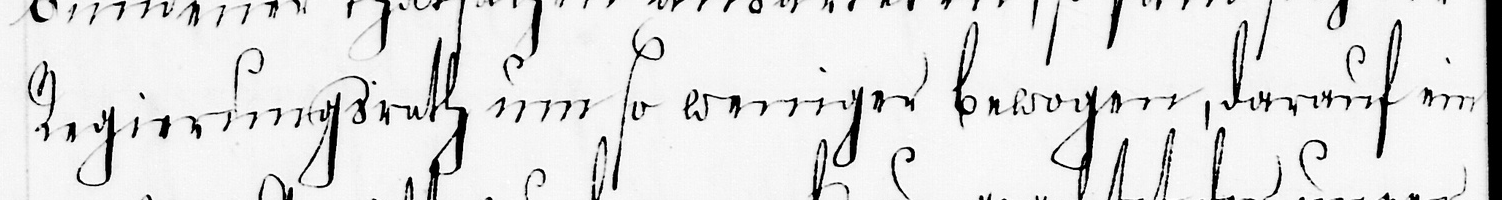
Regierungsrath um so weniger bewogen, darauf ein
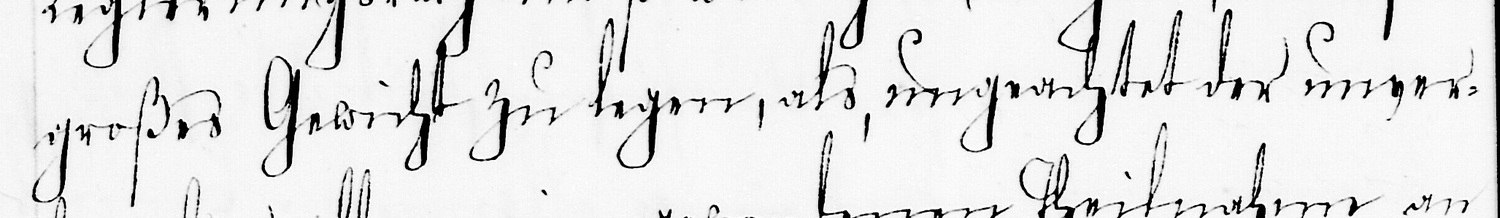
großes Gewicht zu legen, als, ungeachtet der unver¬
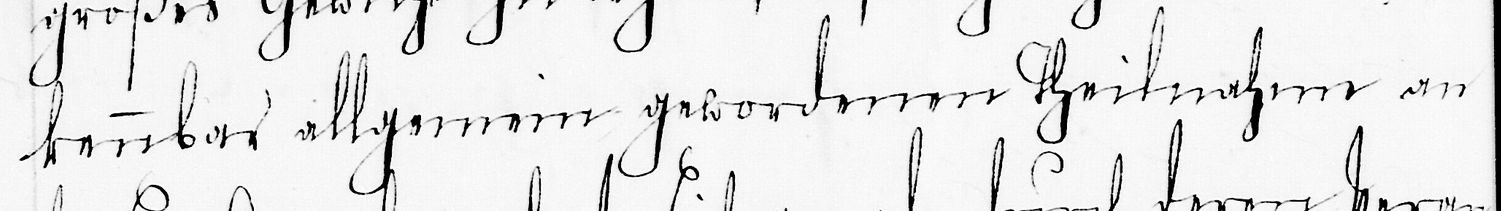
kennbar allgemein gewordenen Theilnahme an
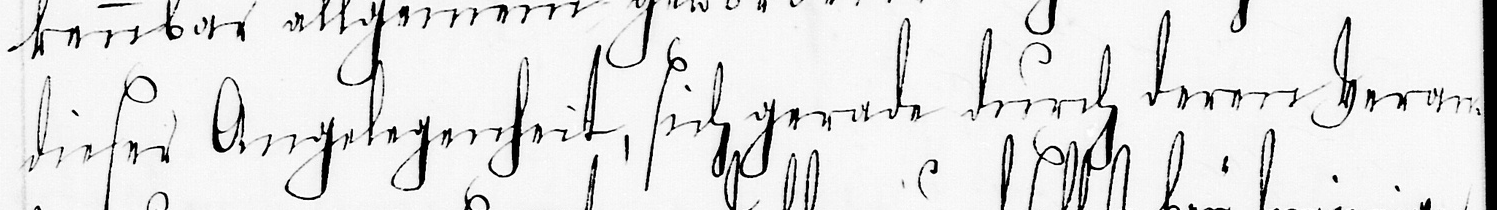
dieser Angelegenheit, sich gerade durch deren Veran¬
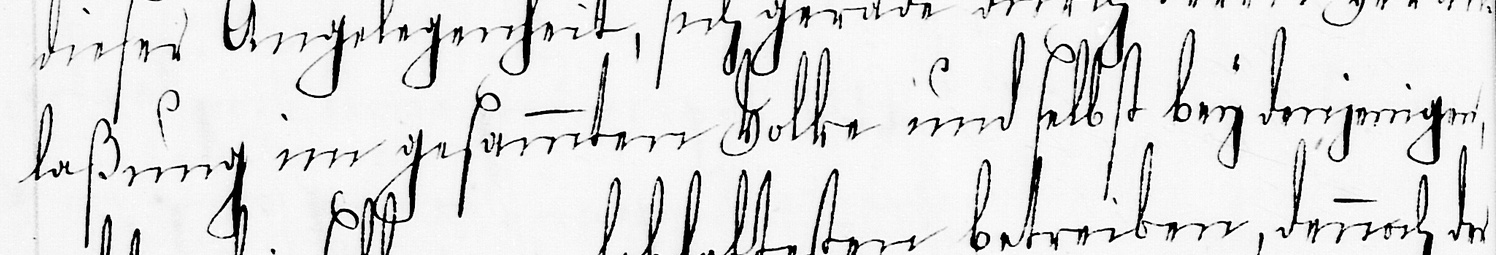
laßung im gesammten Volke und selbst bey denjeni¬
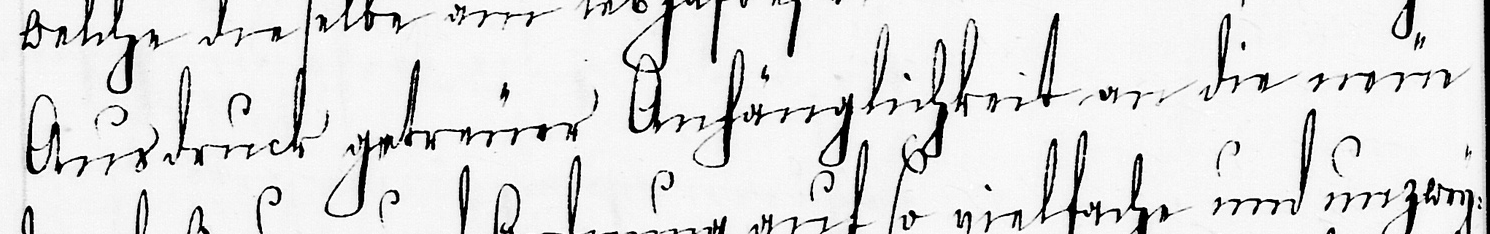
Ausdruck getreuer Anhänglichkeit an die neue
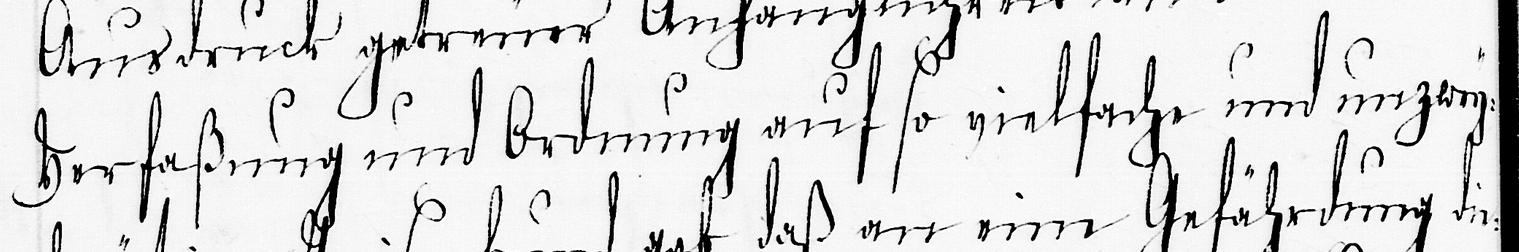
Verfaßung und Ordnung auf so vielfache und unzwey¬
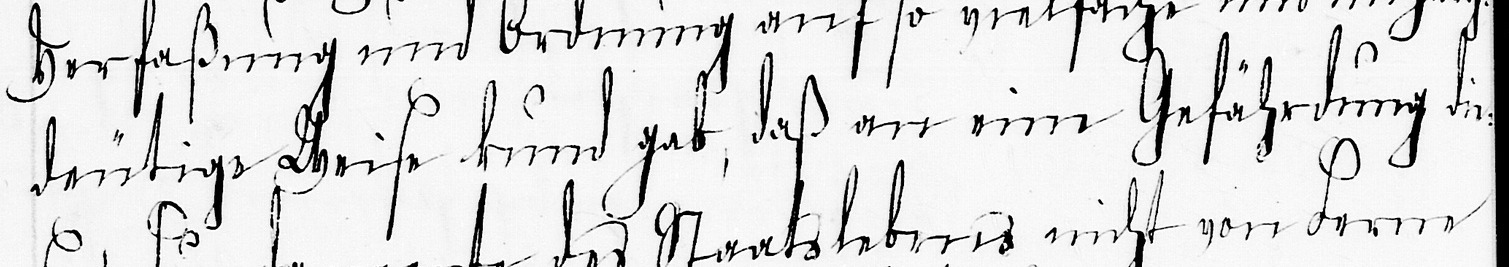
deutige Weise kund gab, daß an eine Gefährdung di¬
